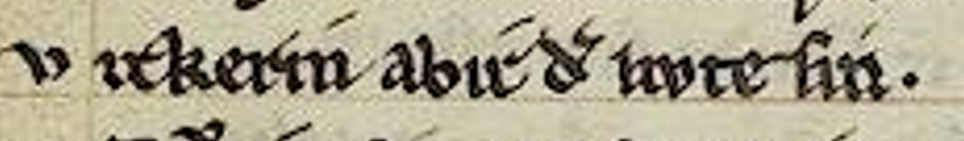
Virkerin abir d(er) livte ſin.
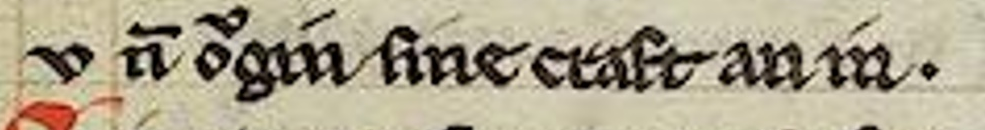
Vn(d) o°vgin ſine craft an in.
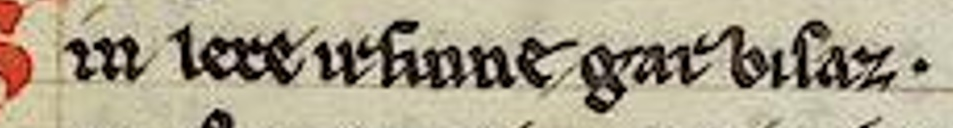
*Sin lere irſinne gar biſaz.
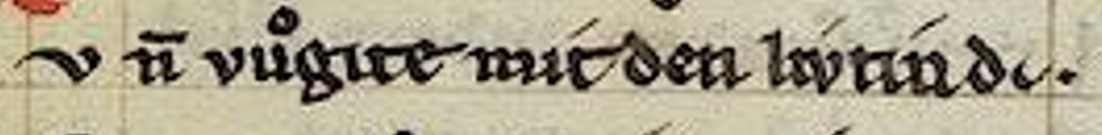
Vn(d) vu°ogite mit den livtin d(az).
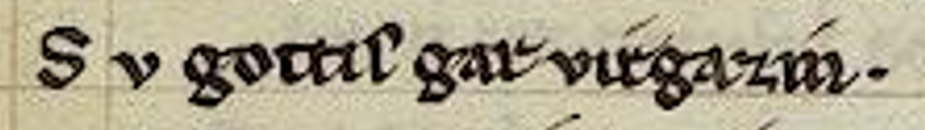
Sv gottiſ gar virgazin.
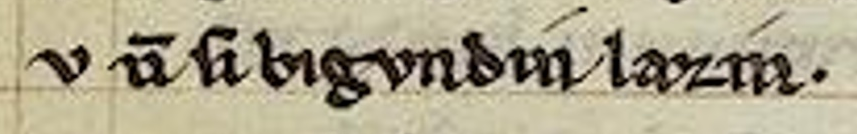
Vn(d) ſi bigvndin lazin.
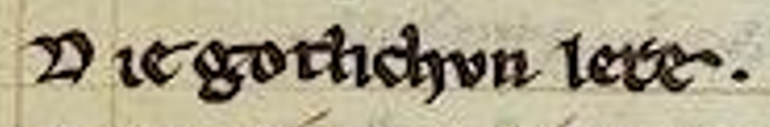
Die gotlichvn lere.
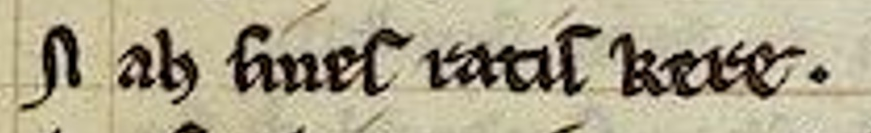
Nah ſineſ ratiſ kere.
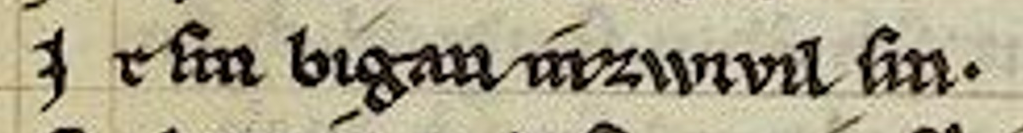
Ir ſin bigan inzwivil ſin.
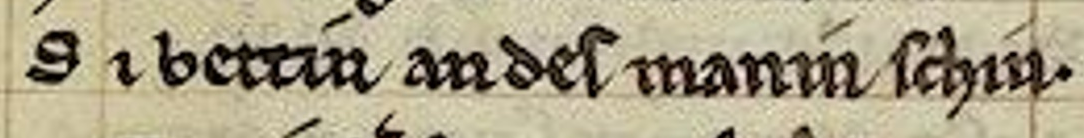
Si bettin an deſ manin ſchin.
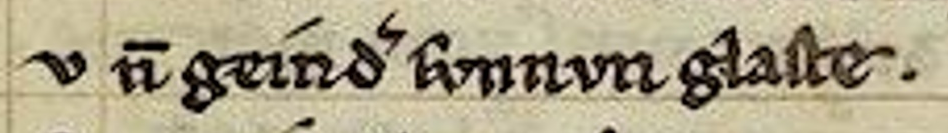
Vn(d) geind(er) ſvnnvn glaſte.
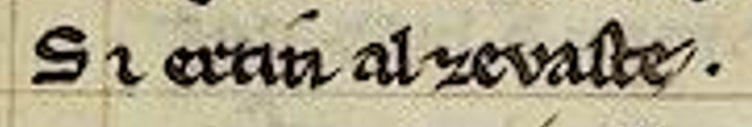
Si ertin al zevaſte.
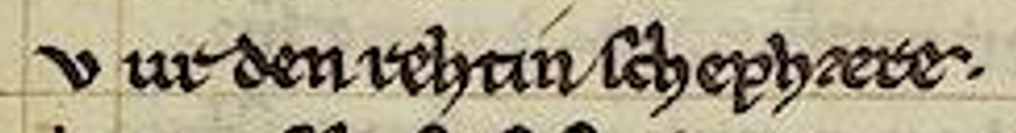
Vur den rehtin ſcheph[ae]re.
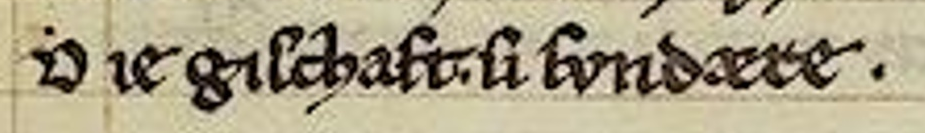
Die giſchaft ſi ſvnd[ae]re.
